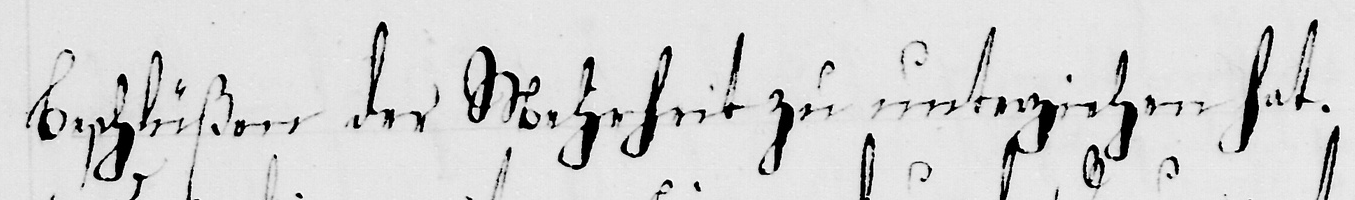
Beschlüßen der Mehrheit zu unterziehen hat.
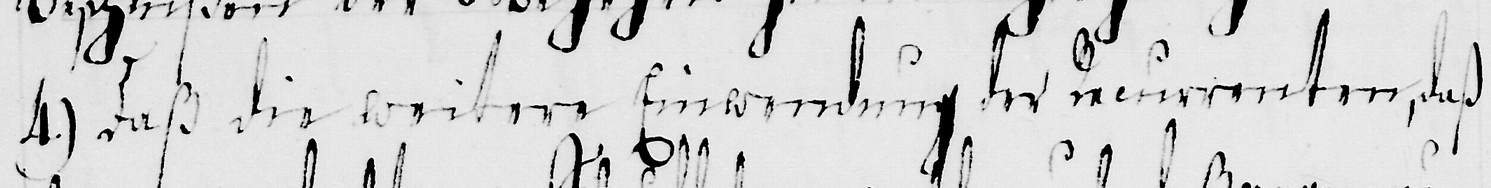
4.) Daß die weitere Einwendung der Recurrenten, daß
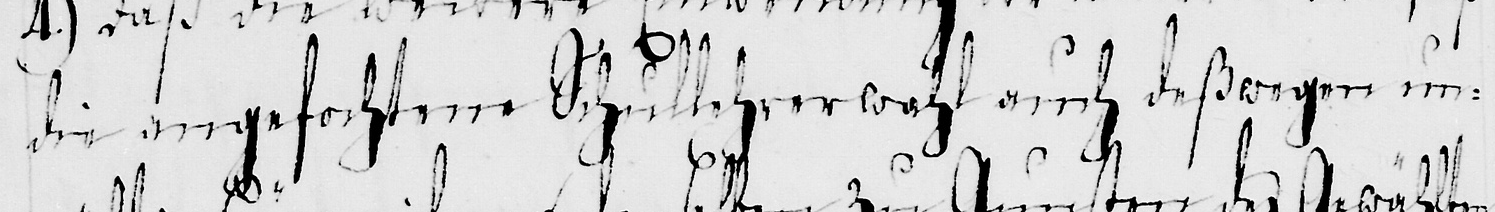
die angefochtene Schullehrerwahl auch deßwegen un¬
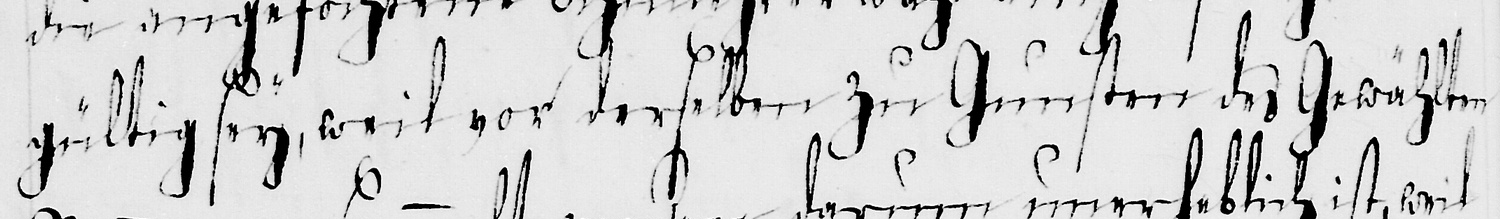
gültig sey, weil vor derselben zu Gunsten des Gewählten
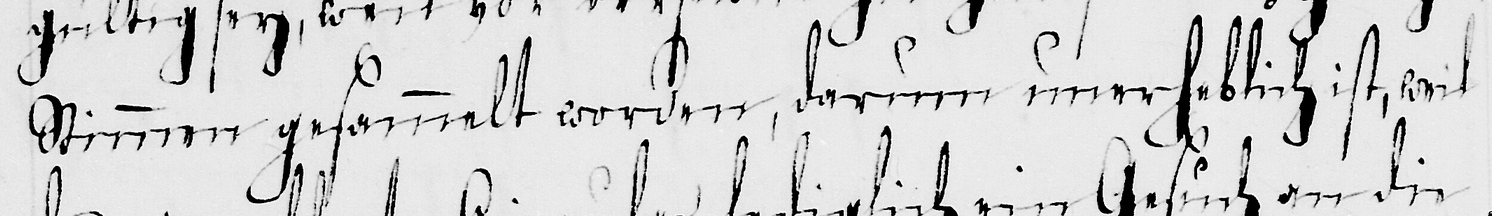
Stimmen gesammelt worden, darum unerheblich ist, weil
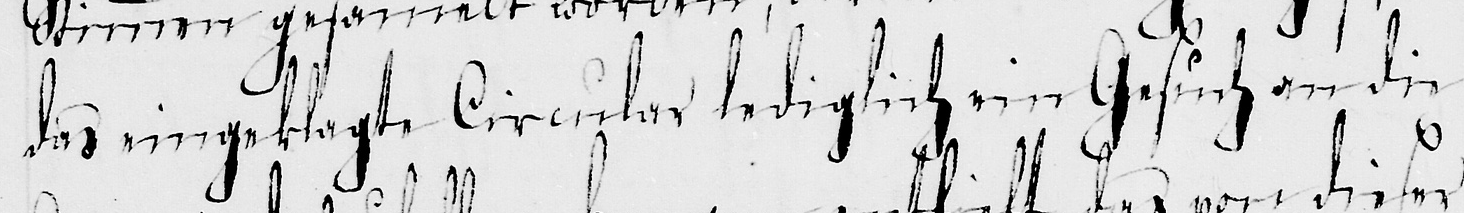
das eingeklagte Circular lediglich ein Gesuch an die
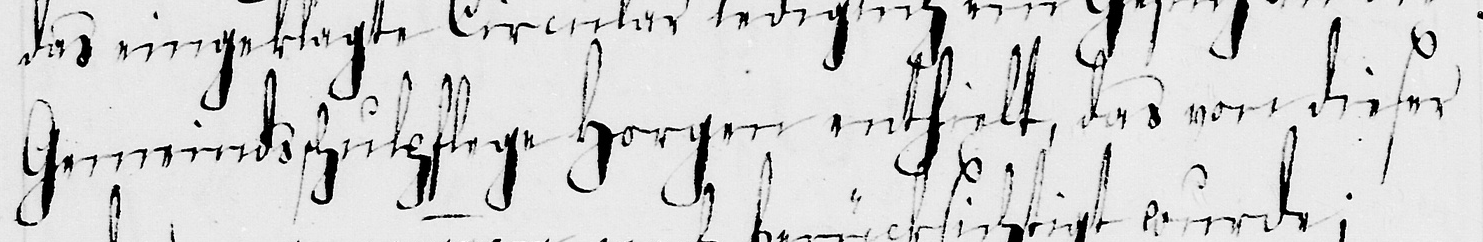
Gemeindsschulpflege Horgen enthielt, das von dieser
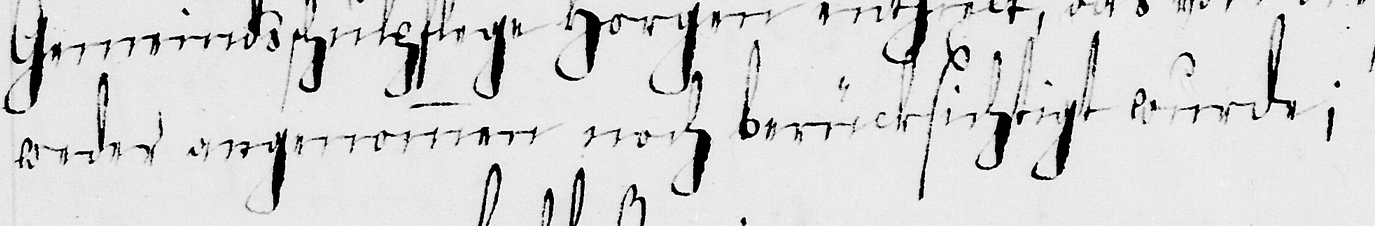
weder angenommen noch berücksichtigt wurde;
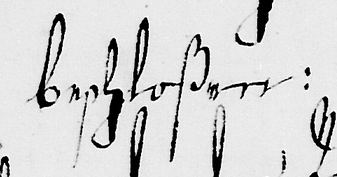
beschloßen:
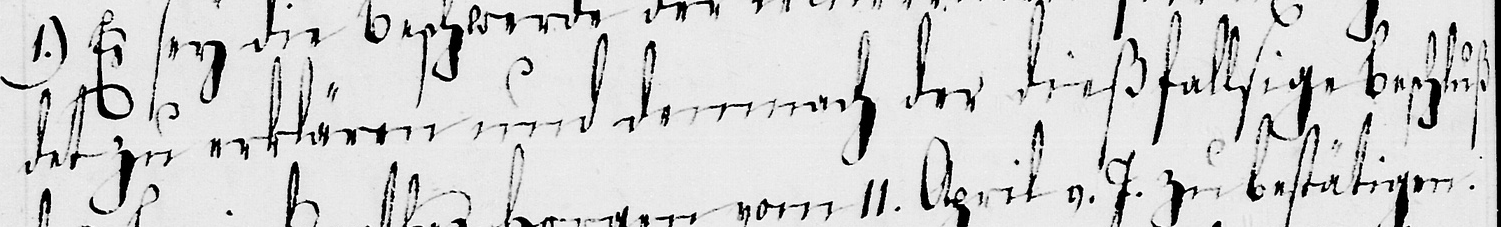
det zu erklären und demnach der dießfallsige Besch¬
